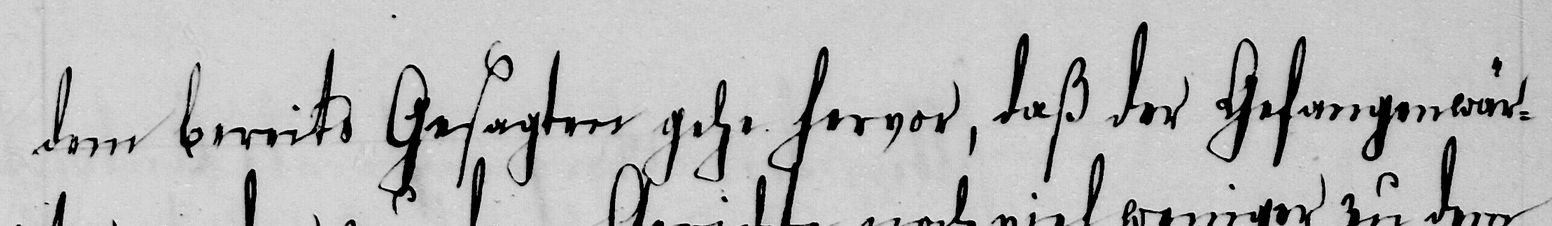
dem bereits Gesagten gehe hervor, daß der Gefangenwär¬
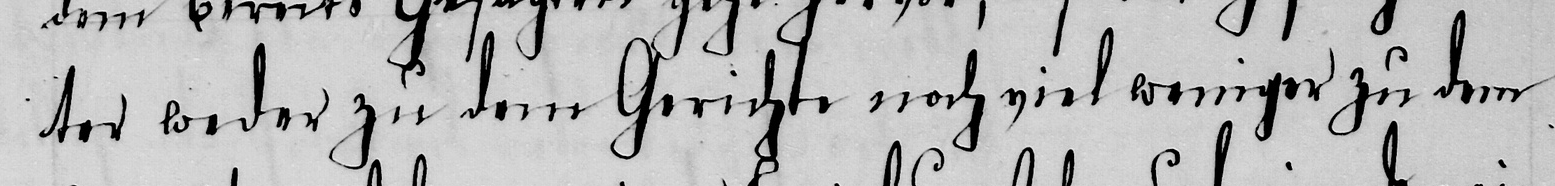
ter weder zu dem Gerichte noch viel weniger zu dem
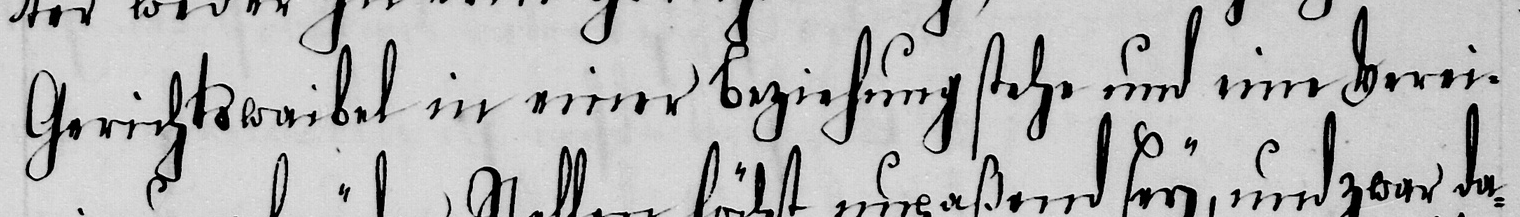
Gerichtswaibel in einer Beziehung stehe und eine Verei¬
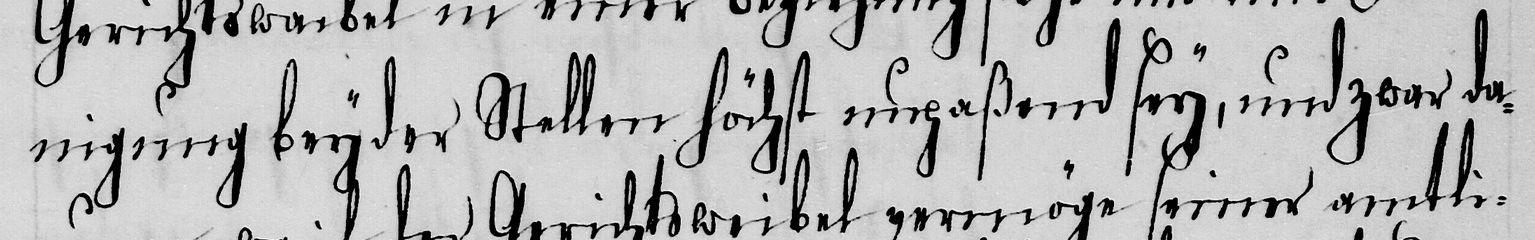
nigung bey der Stellen höchst unpaßend sey, und zwar da¬
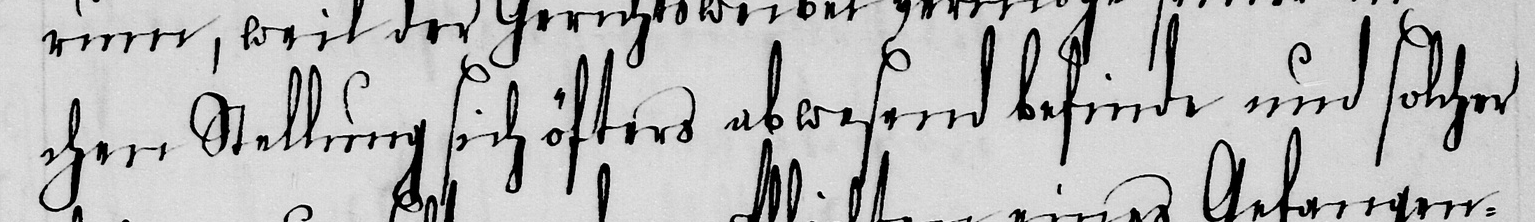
chen Stellung sich öfters abwesend befinde und solcher
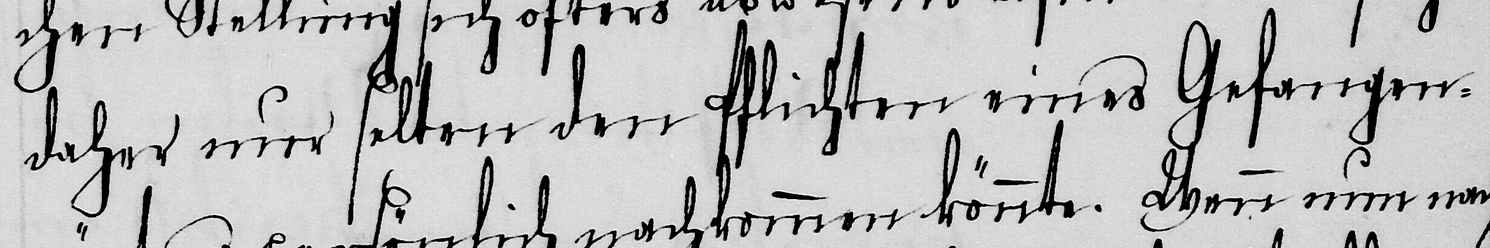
daher nur selten den Pflichten eines Gefangen¬
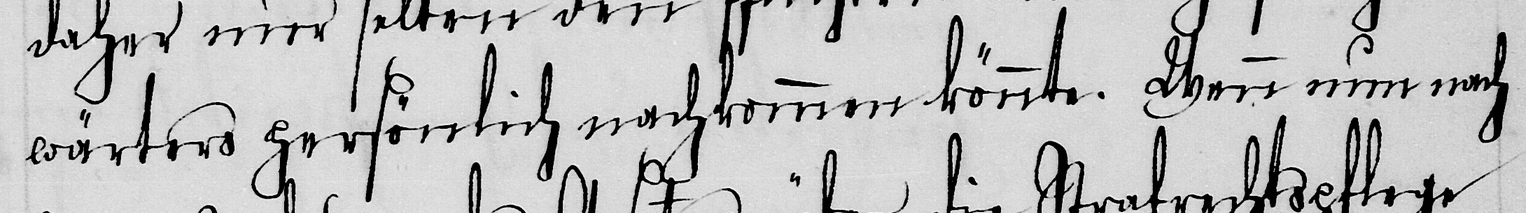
wärters persönlich nachkommen könnte. Wenn nun nach
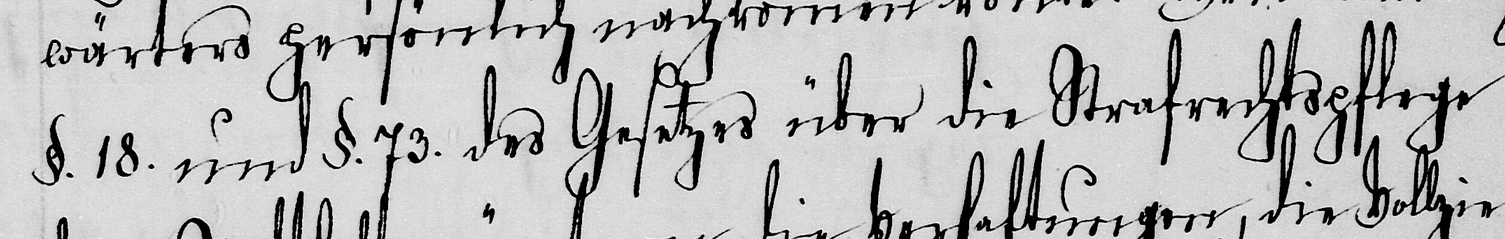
§. 18. und 73. des Gesetzes über die Strafrechtspflege
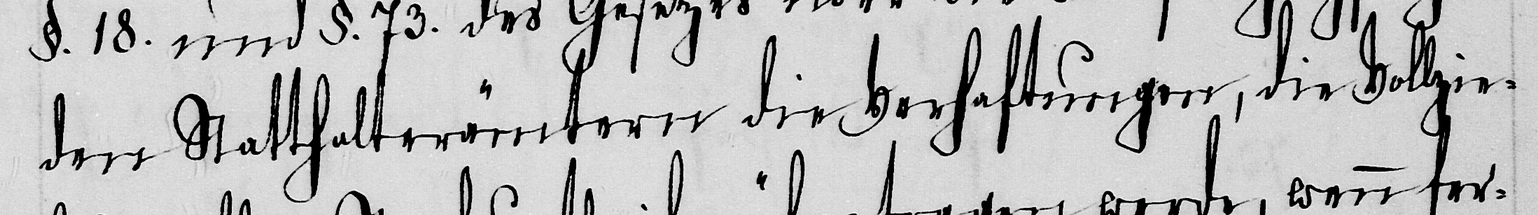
den Statthalterämtern die Verhaftungen, die Vollzi¬
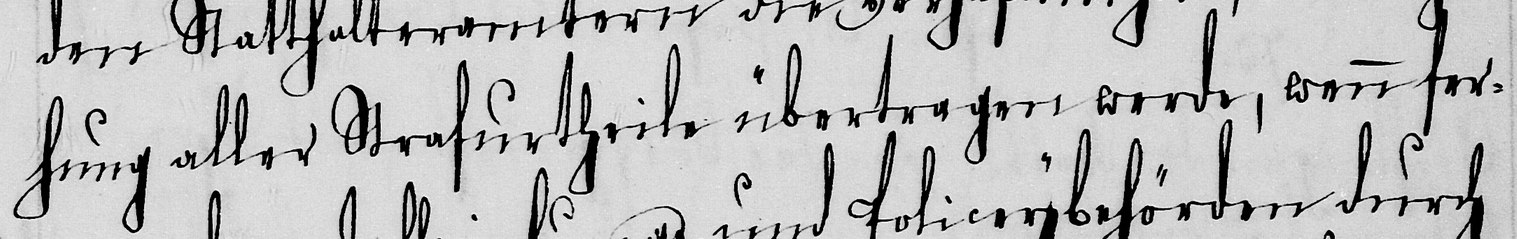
ehung aller Strafurtheile übertragen werde, wenn fer¬
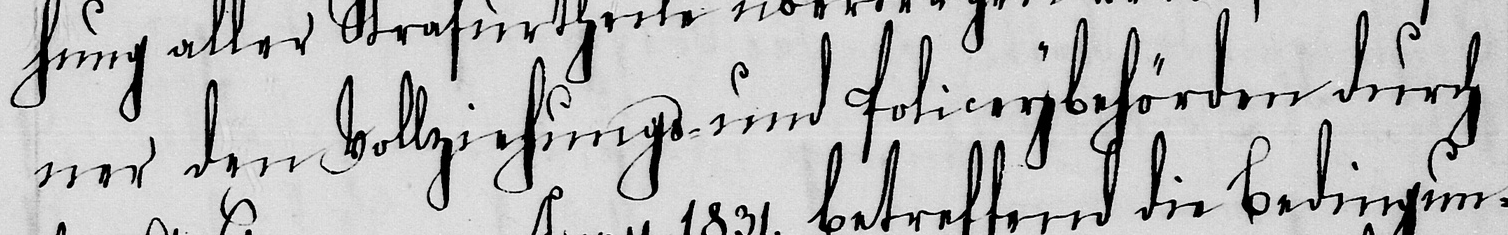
ner den Vollziehungs- und Policeybehörden durch
